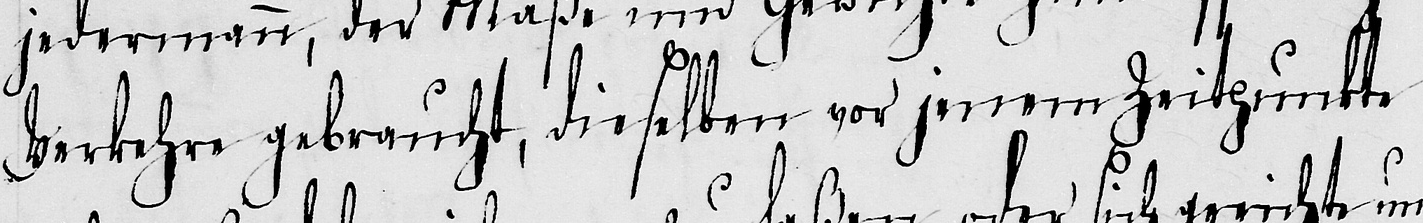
Verkehre gebraucht, dieselben vor jenem Zeitpunkte
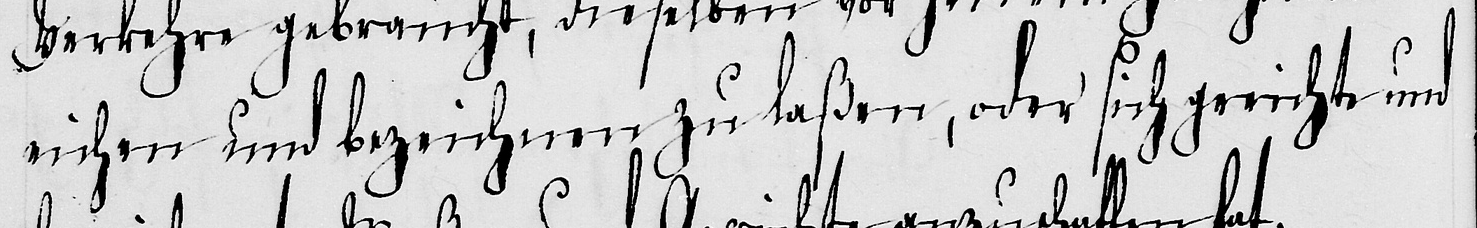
eiche und bezeichnen zu laßen, oder sich geeichte und
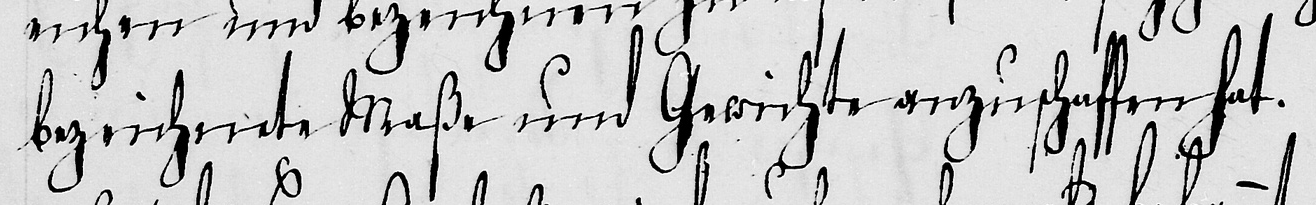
bezeichnete Maße und Gewichte anzuschaffen hat.
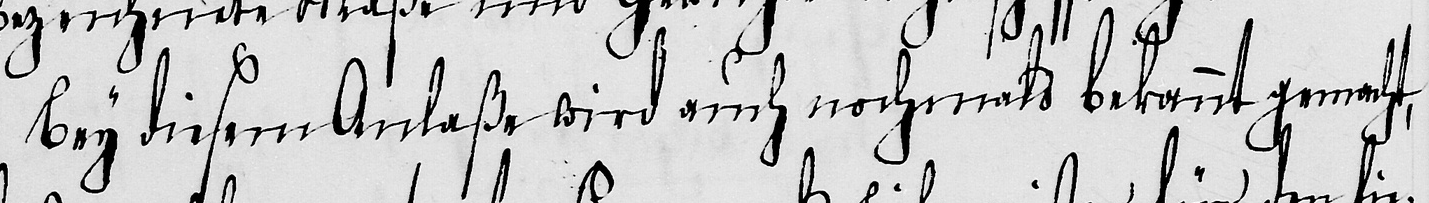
Bey diesem Anlaße wird auch nochmals bekannt gemach¬
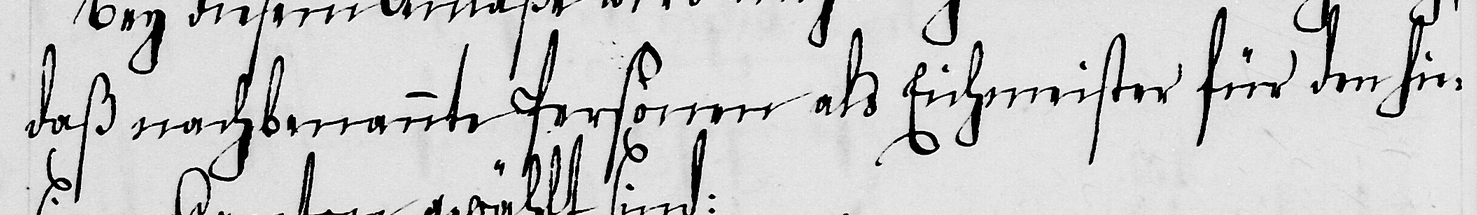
daß nachbenannte Personen als Eichmeister für den hie¬
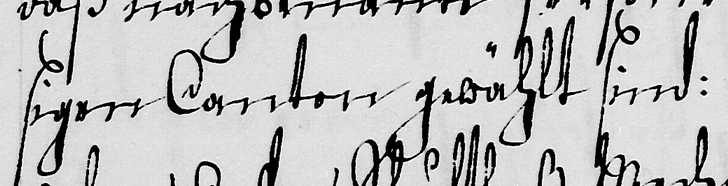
sigen Canton gewählt sind:
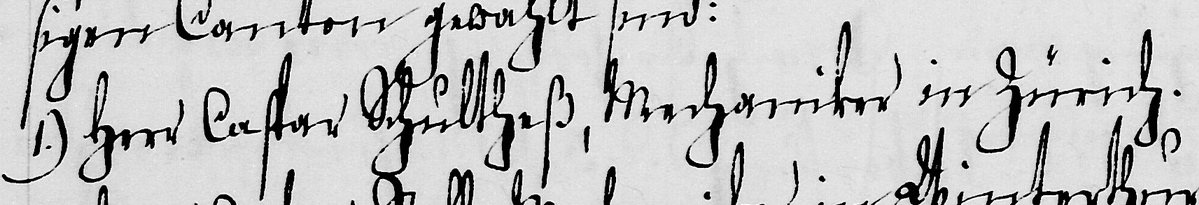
1.) Herr Caspar Schultheß, Mechaniker in Zürich.
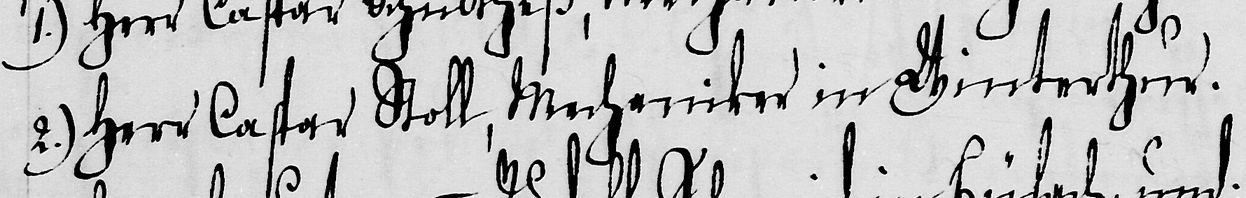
2.) Herr Caspar Stoll, Mechaniker in Winterthur.
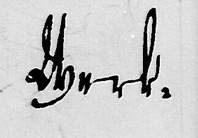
Werk¬
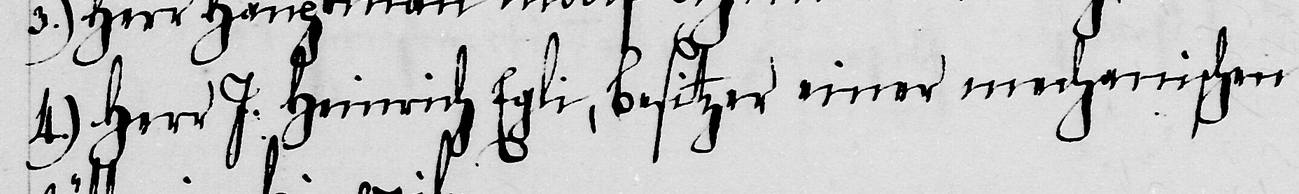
4.) Herr J. Heinrich Egli, Besitzer einer mechanischen
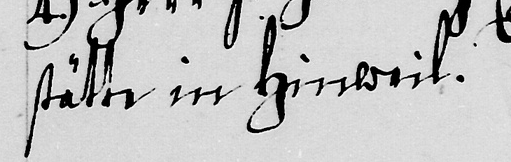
stätte in Hinweil.
